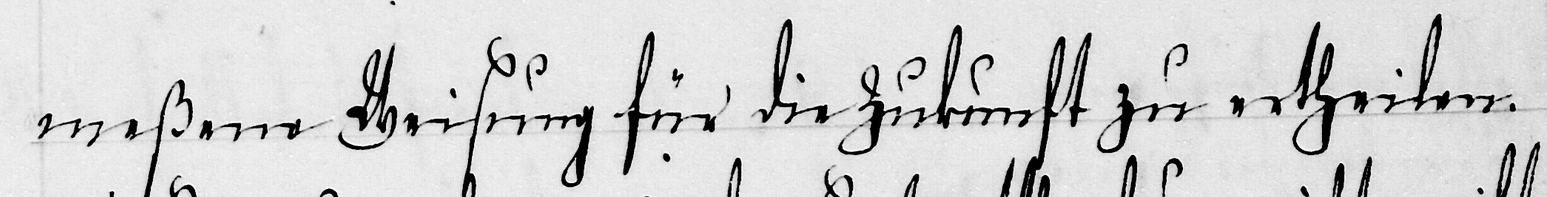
meßene Weisung für die Zukunft zu ertheilen.
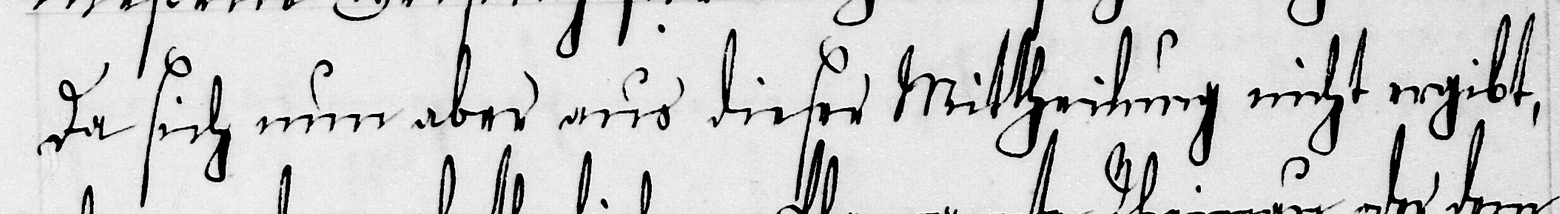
Da sich nun aber aus dieser Mittheilung nicht ergibt,
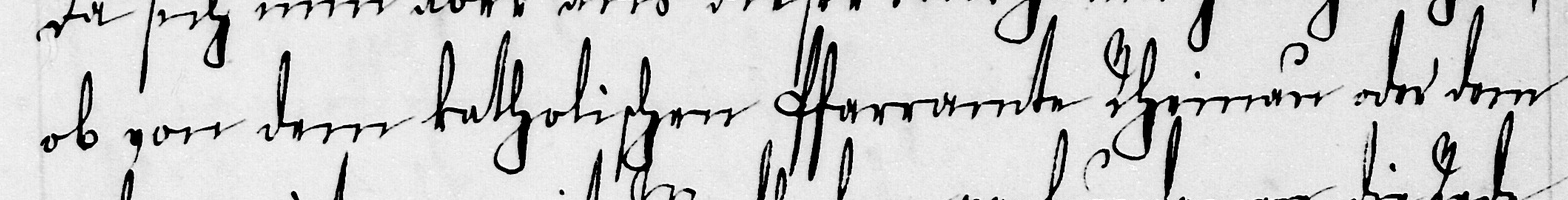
ob von dem katholischen Pfarramte Rheinau oder dem
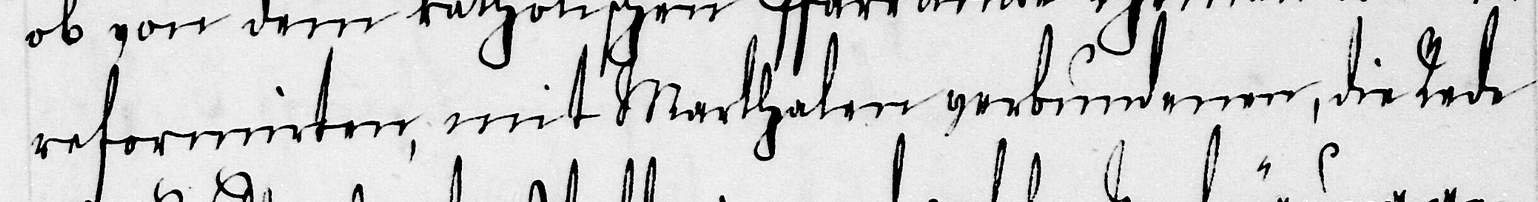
reformirten, mit Marthalen verbundenen, die Rede
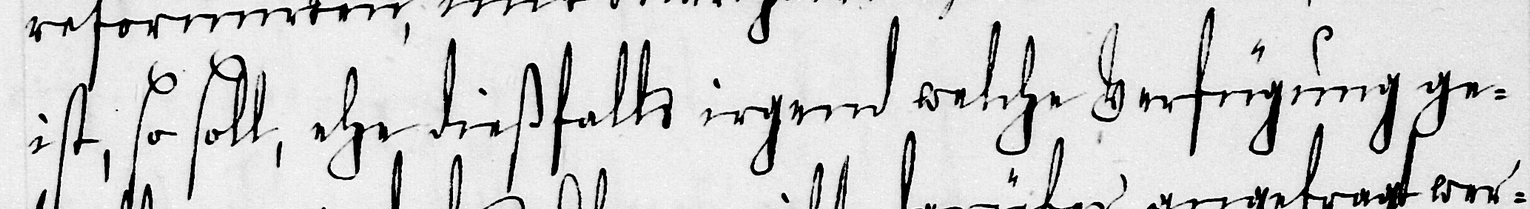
so soll, ehe dießfalls irgend welche Verfügung ge¬
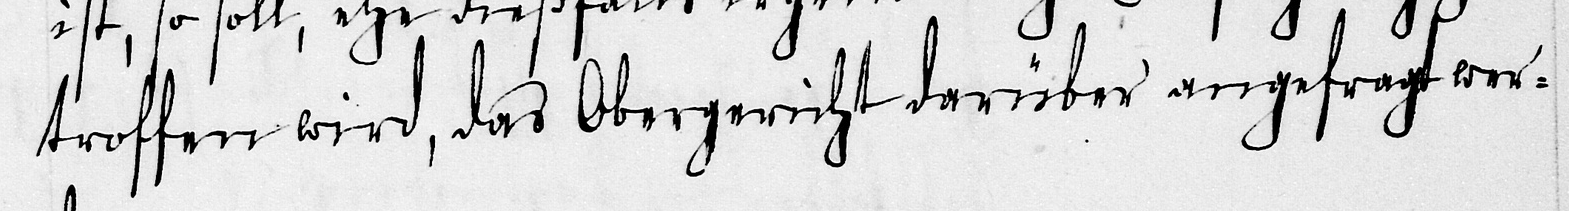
troffen wird, das Obergericht darüber angefragt wer¬
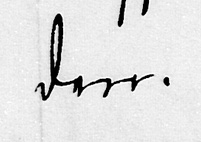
den.
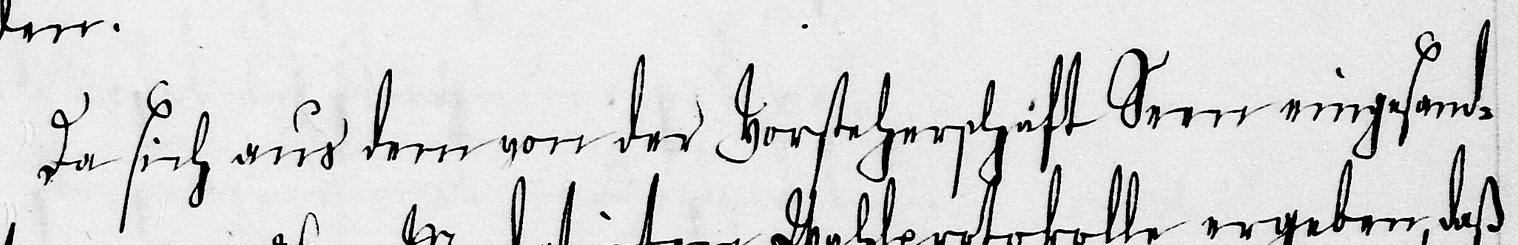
Da sich aus dem von der Vorsteherschaft Seen eingesand¬
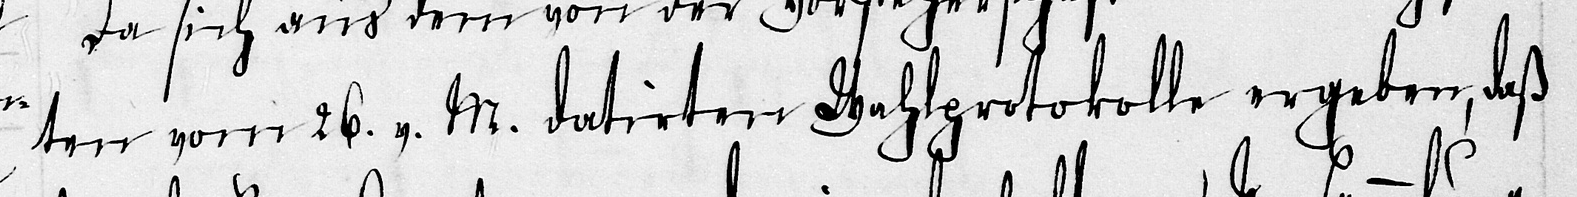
ten vom 26. v. M. datirten Wahlprotokolle ergeben, daß
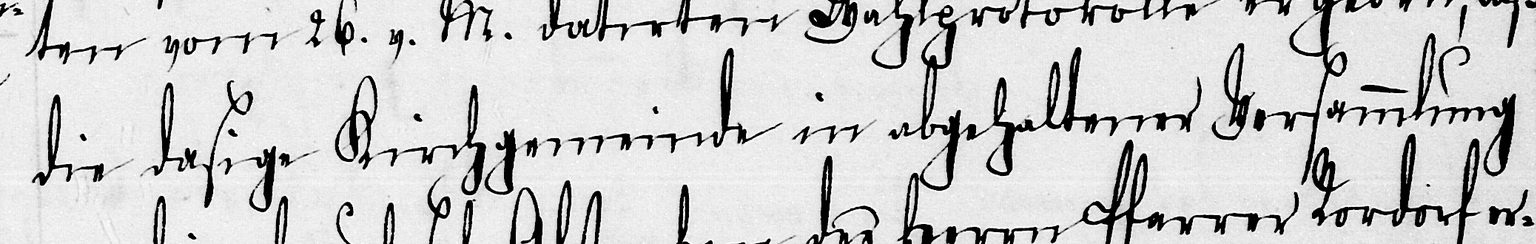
die dasige Kirchgemeinde in abgehaltener Versammlung
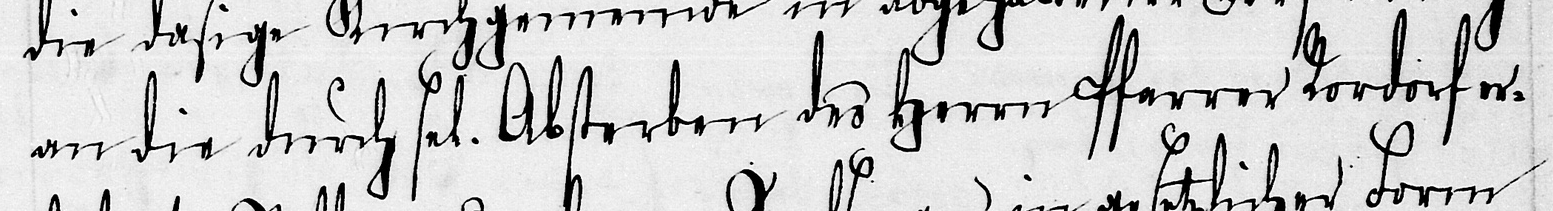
an die durch sel. Absterben des Herrn Pfarrer Rordorf e¬
